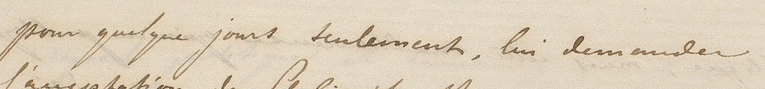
pour quelque jours seulement, lui demander
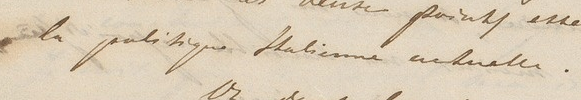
la politique Italienne actuelle.
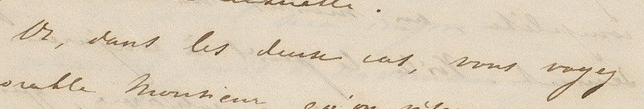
Or, dans les deux cas, vous voyez
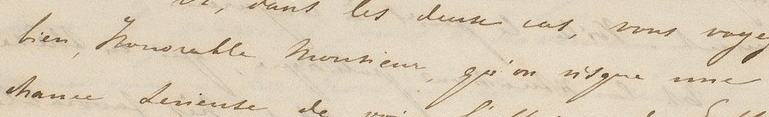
bien, Honorable Monsieur, qu'on risque une
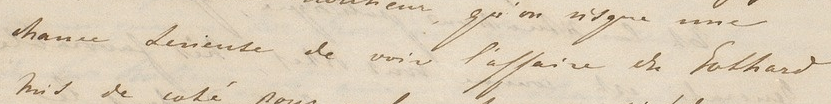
chance serieuse de voir l'affaire du Gothard
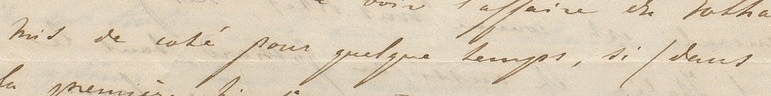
mis de coté pour quelque temps, si (dans
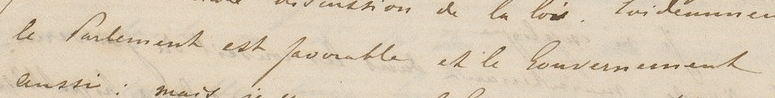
le Parlement est favorable et le Gouvernement
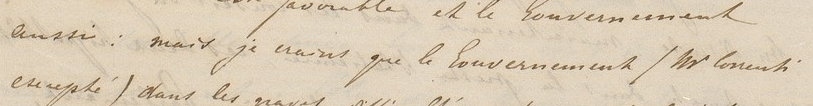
aussi: mais je crains que le Gouvernement (MrCorrenti
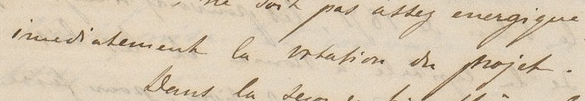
imediatement la votation du projet.
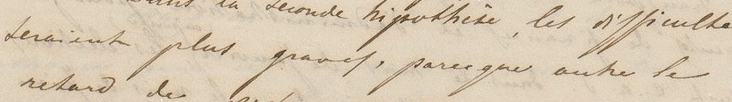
seraient plus graves, parceque outre le
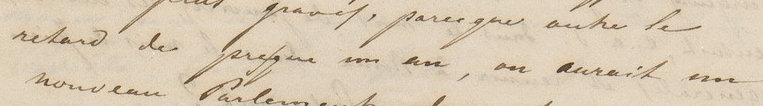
retard de presque un an, on aurait un
